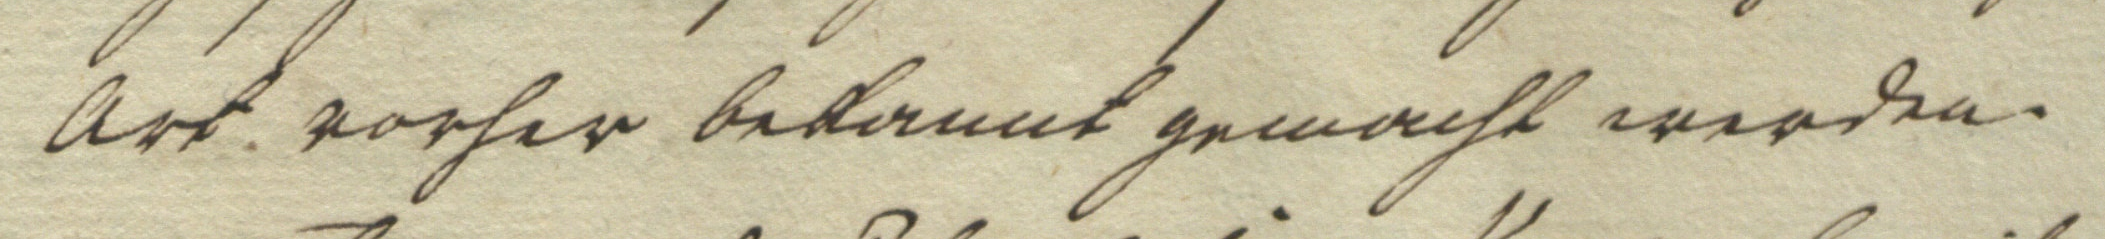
Art vorher bekannt gemacht werden.
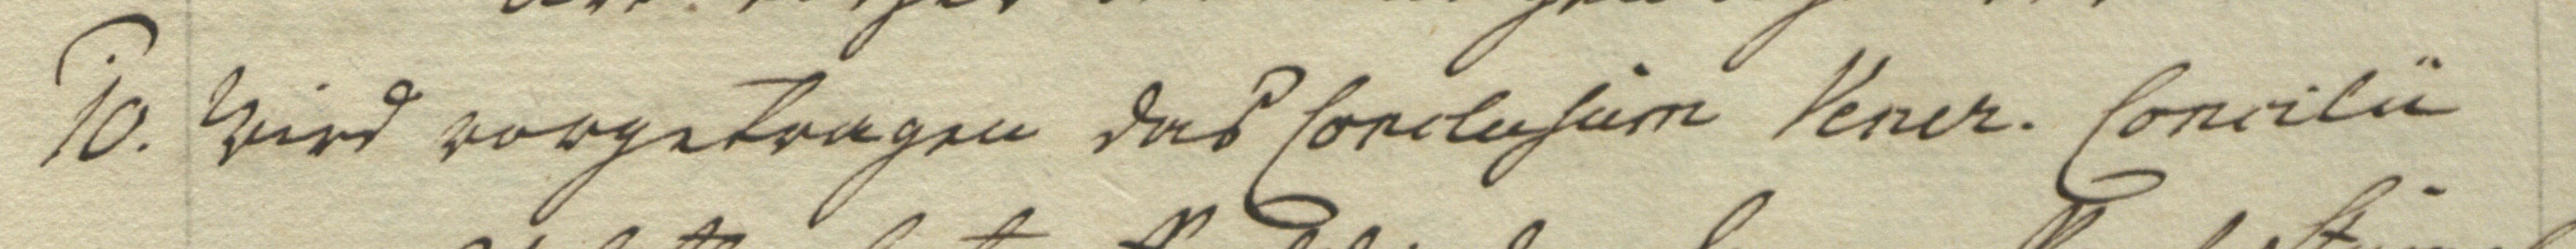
10. Wird vorgetragen das Conclusum Vener. Concilii
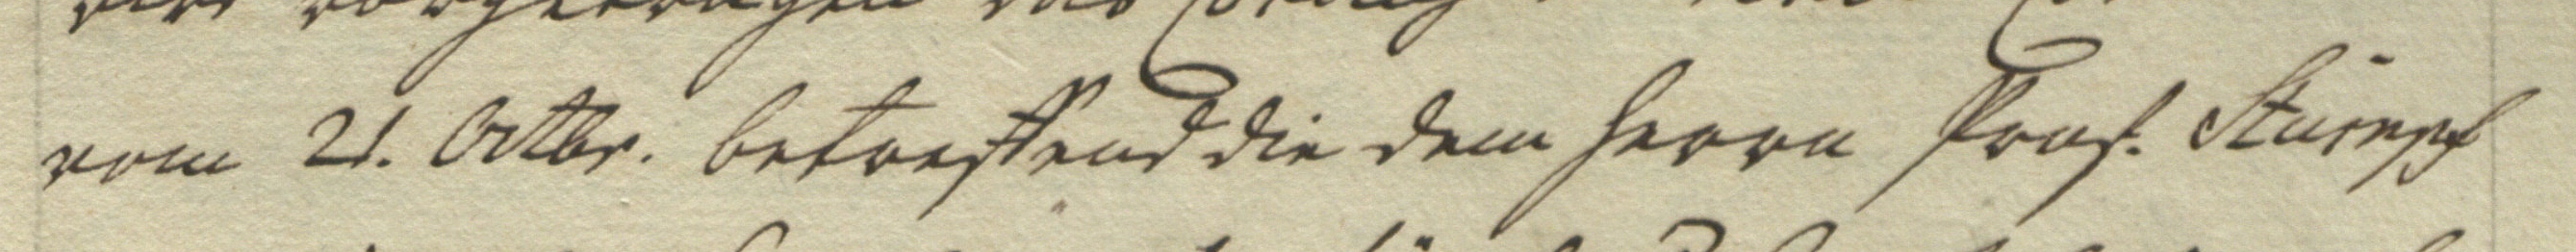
vom 21. Octbr. betreffend die dem Herrn Prof. Stumpf
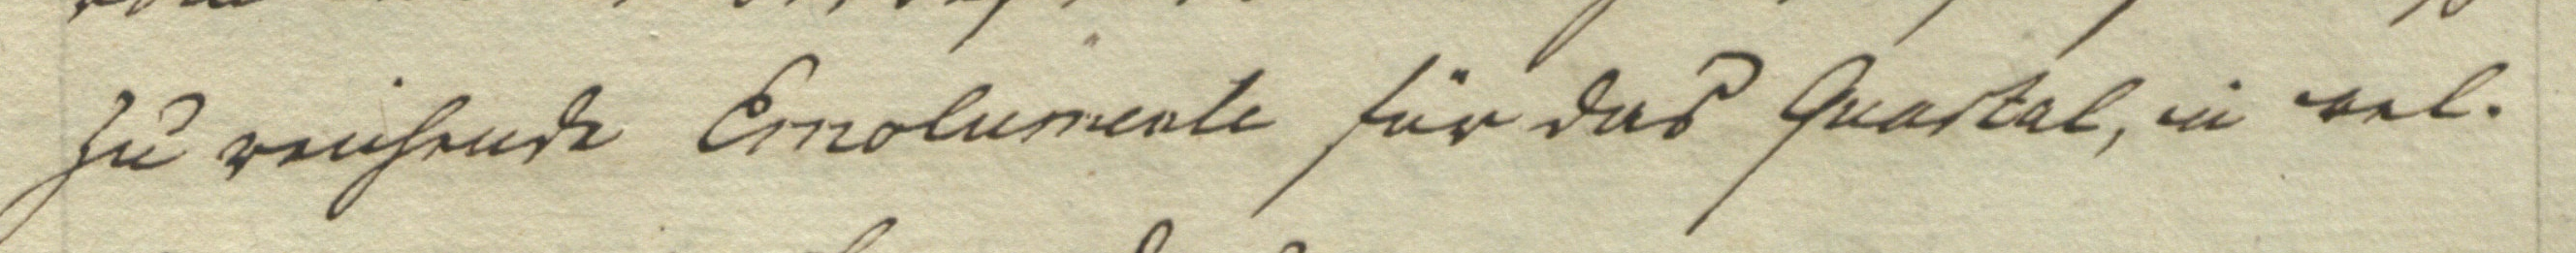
zu reichende Emolumente für das Quartal, in wel¬
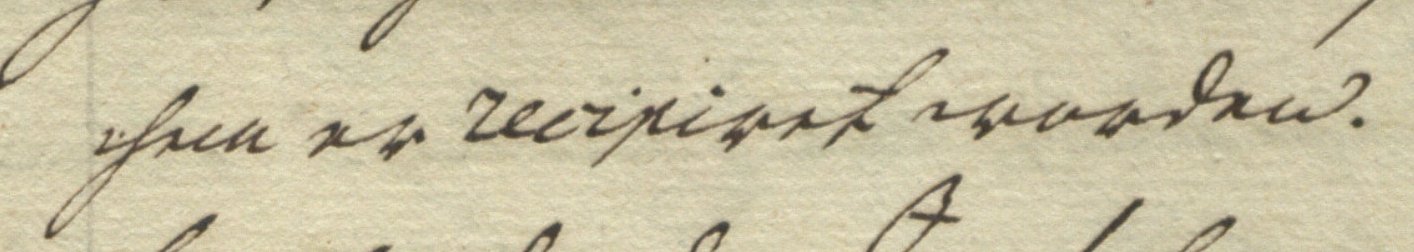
chem er recipiret worden.
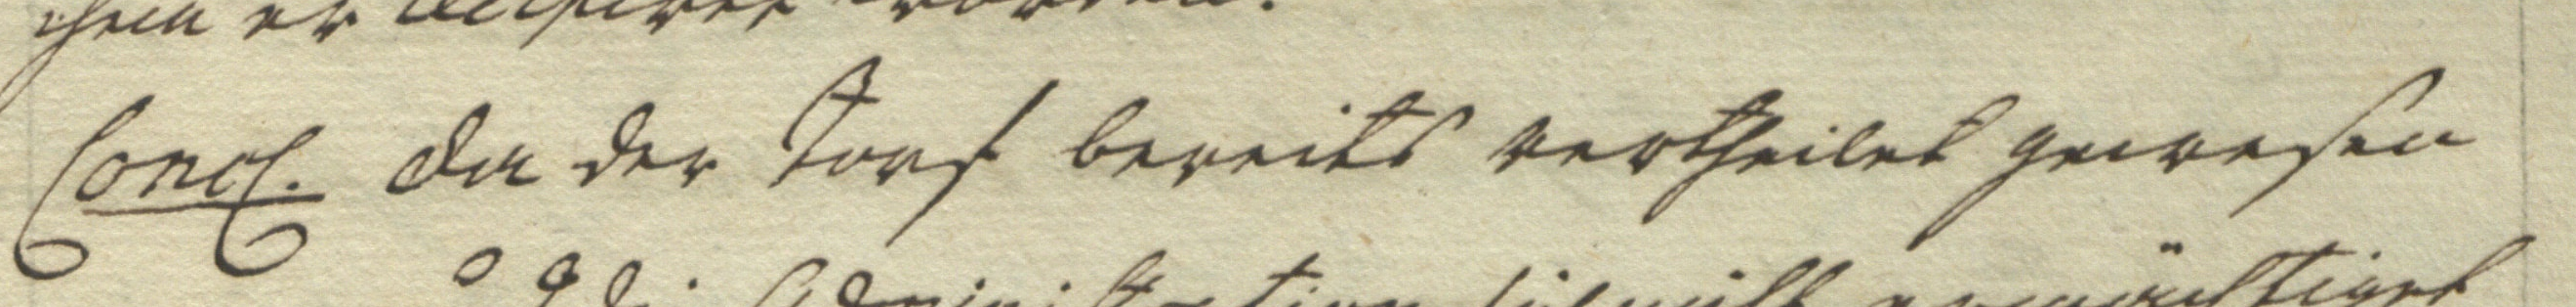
Concl. Da der Torf bereits vertheilet gewesen
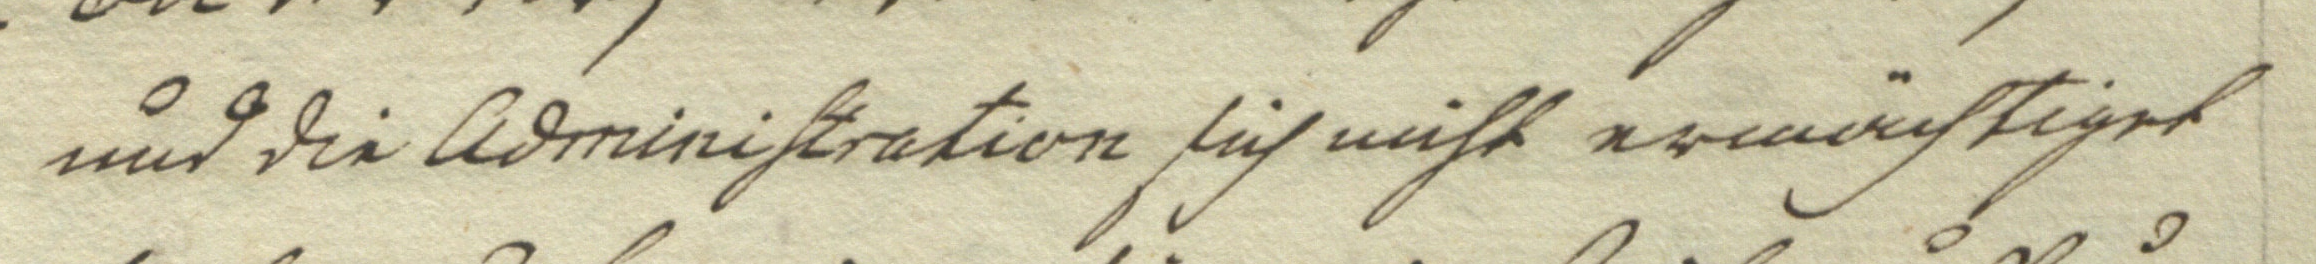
und die Administration sich nicht ermächtiget
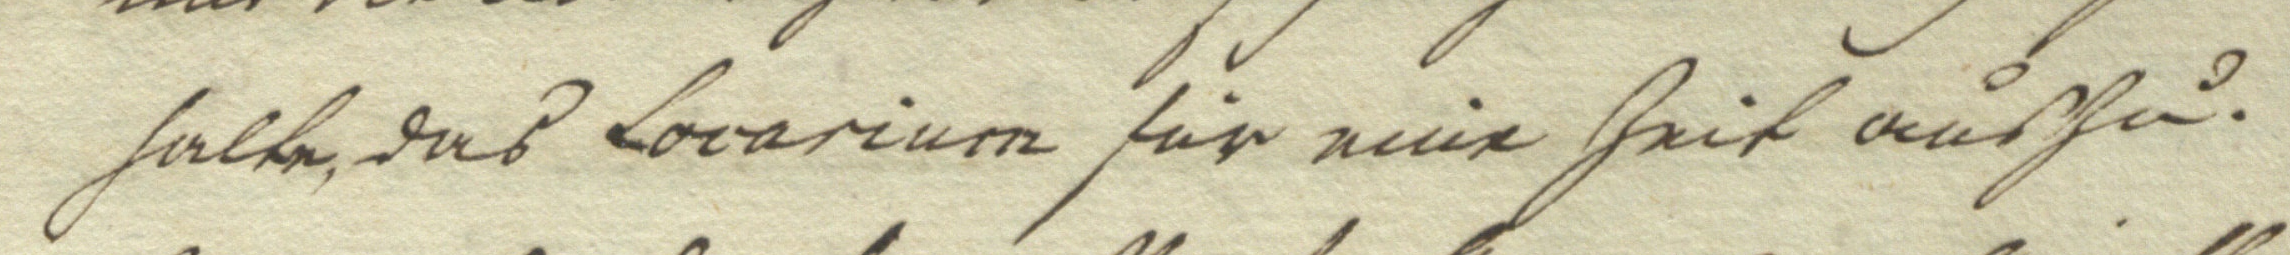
halte, das Locarium für eine Zeit anszu¬
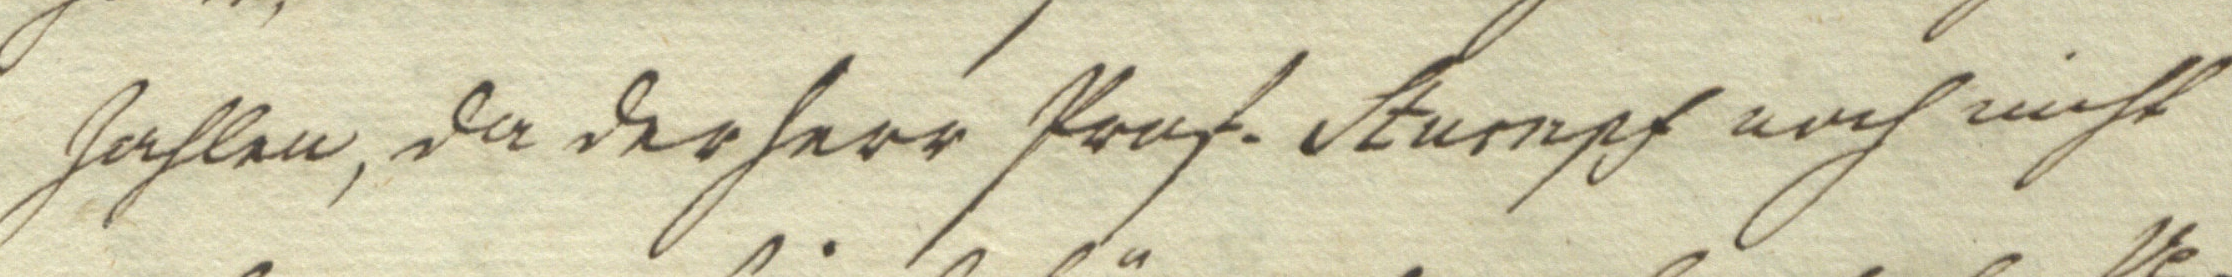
zahlen, da der Herr Prof. Stumpf noch nicht
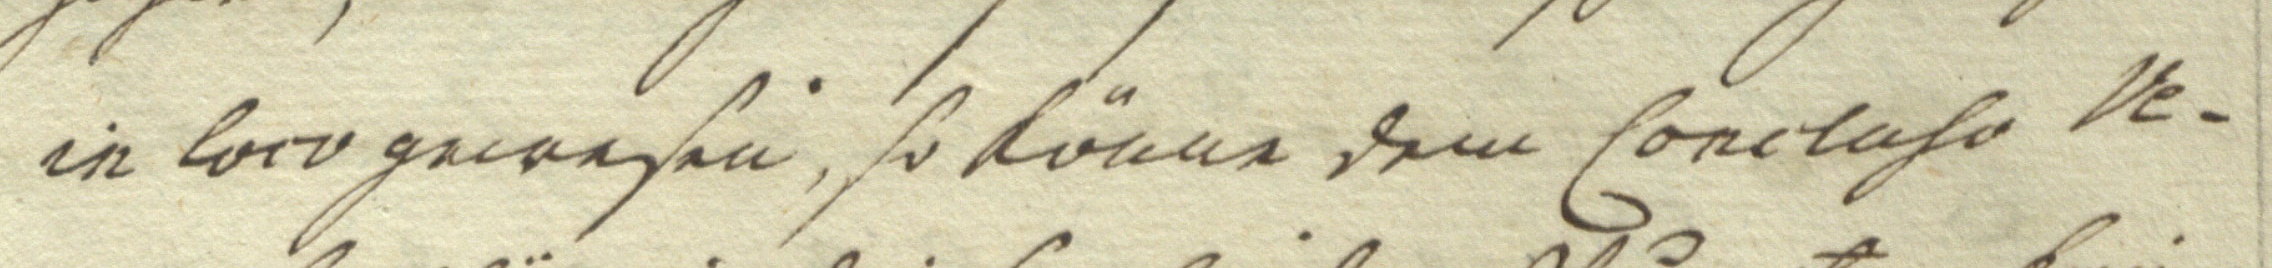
in loco gewesen, so könne dem Concluso Ve¬
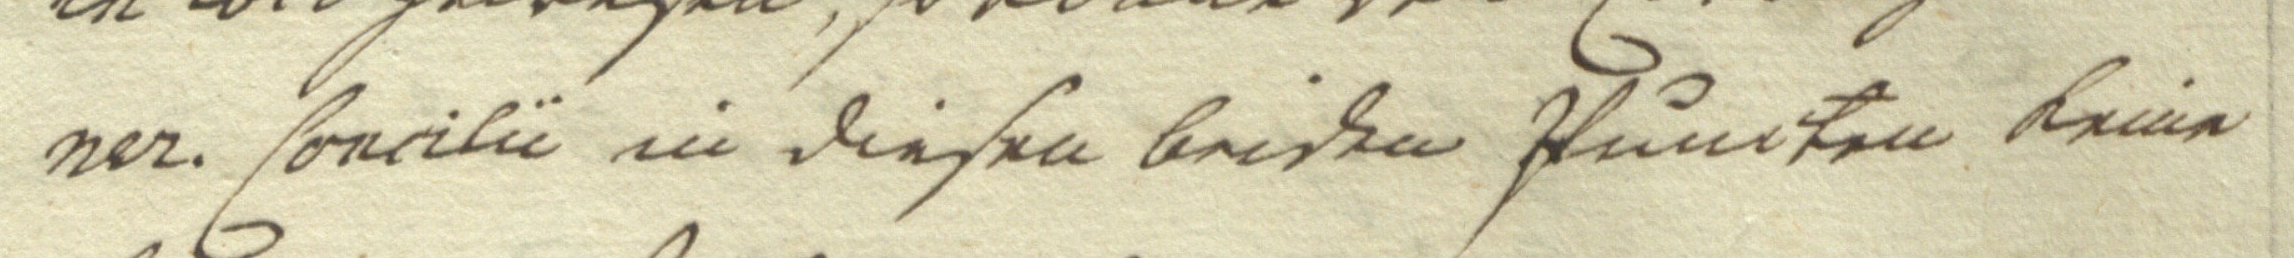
ner. Concilii in diesen beiden Puncten keine
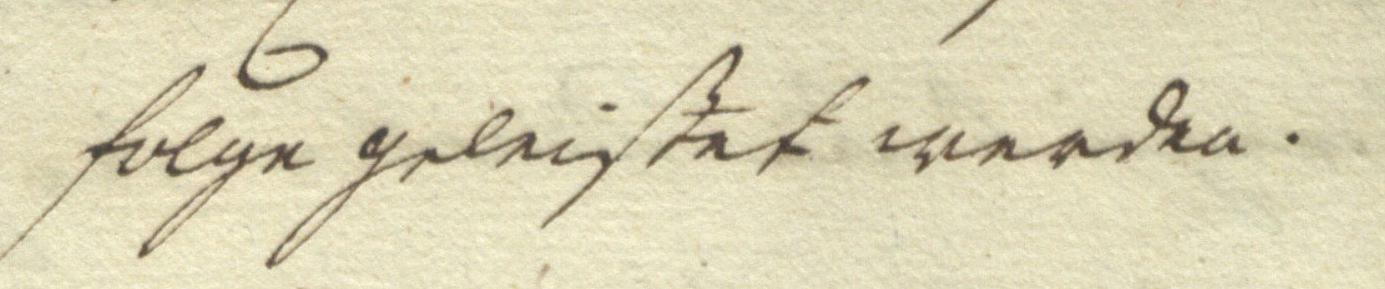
Folge geleistet werden.
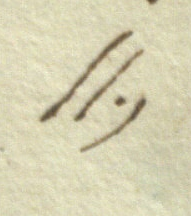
11.,
